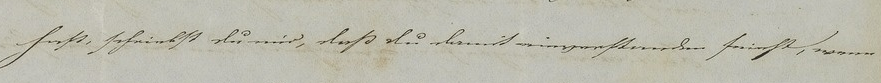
hast, schreibst Du mir, daß Du damit einverstanden seiest, wenn
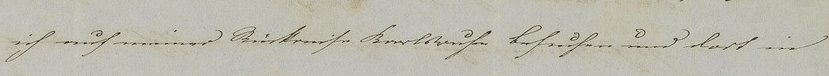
ich auf meiner Rückreise Karlsruhe besuchen und dort in
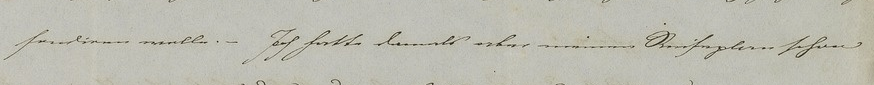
sondiren wolle. – Ich hatte damals aber meinen Reiseplan schon
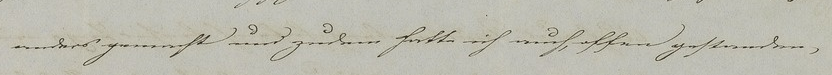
anders gemacht und zudem hatte ich auch, offen gestanden,
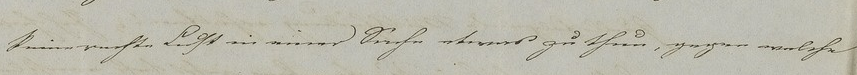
keine rechte Lust in einer Sache etwas zu thun, gegen welche
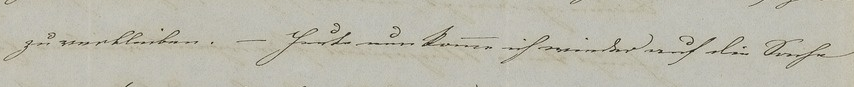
zu verbleiben. – Heute nun komme ich wieder auf die Sache
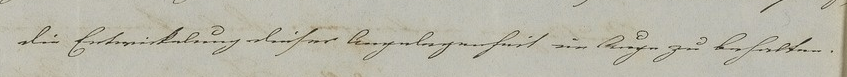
die Enwickelung dieser Angelegenheit im Auge zu behalten.
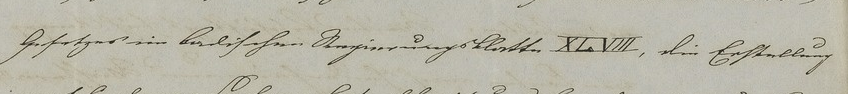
Gesetzes im badischen Regierungsblatte XLVIII, die Erstellung
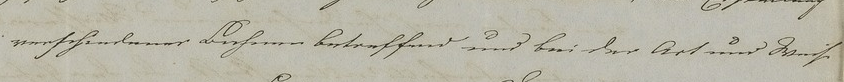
verschiedener Bahnen betreffend und bei der Art und Weise
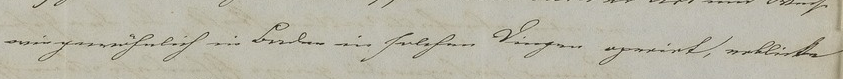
wie gewöhnlich in Baden in solchen Dingen operirt, erblicke
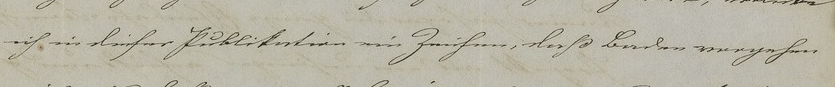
ich in dieser Publikation ein Zeichen, daß Baden vorgehen
